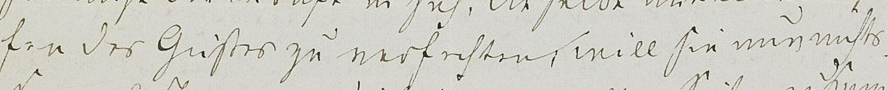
fen des Geistes zu verfechten; will sie nur nichts
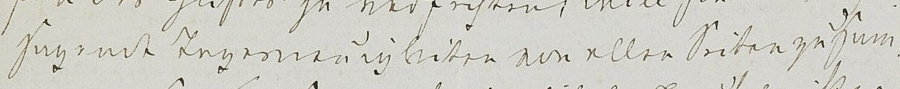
sagende Tagesneuigkeiten von allen Seiten zusam-
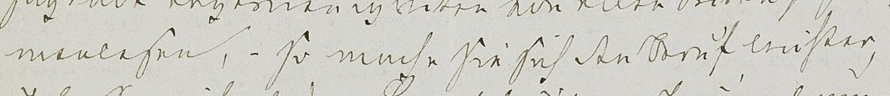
menlesen, – so mache sie sich den Beruf leichter,
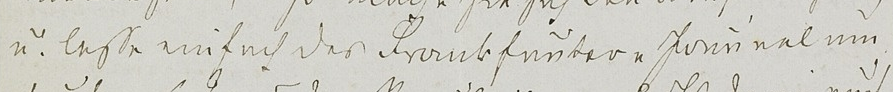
u. lasse einfach das Frankfurter-Journal um-
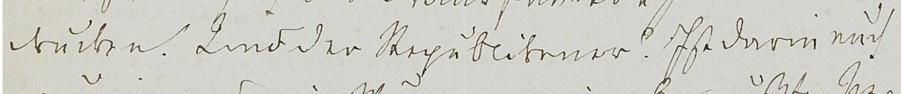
drucken. Und der Republikaner? Ist darin auch
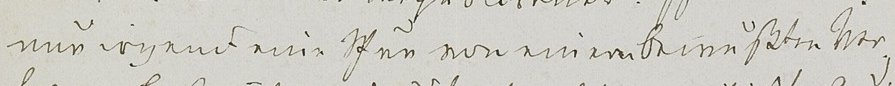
nur irgend eine Spur von einem bewußten Ver-
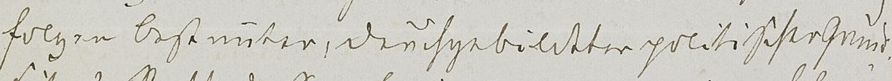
folgen bestimmter, durchgebildeter politischer Grund-
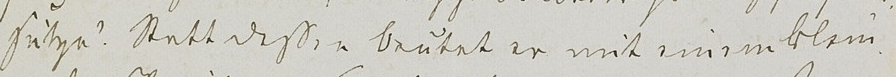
sätze? Satt dessen beutet er mit einem klein-
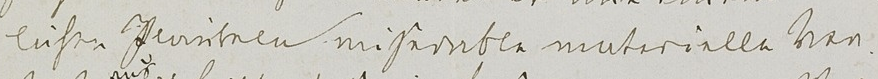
lichen Plänkeln miserable materielle Ver-
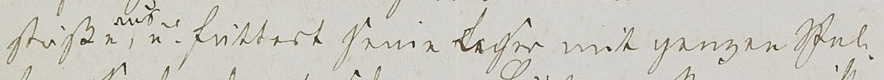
stöße aus, u. füttert seine Leser mit ganzen Spal-
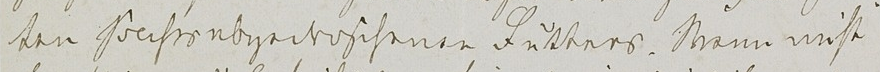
ten solches abgedroschenen Futters. Wenn nicht
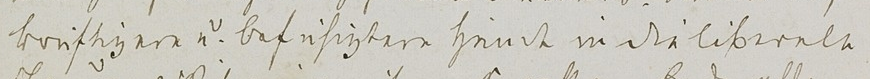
kräftigere u. befähigtere Hände in die liberale
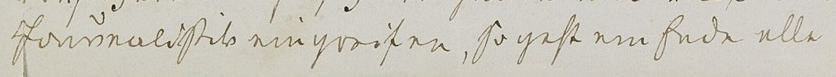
Journalistik eingreifen, so geht am Ende alle
